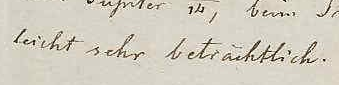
leicht sehr beträchtlich.
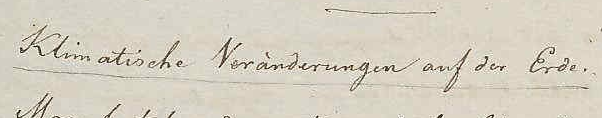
Klimatische Veränderungen auf der Erde.
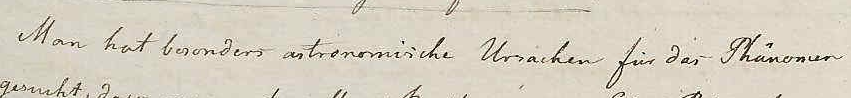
Man hat besonders astronomische Ursachen für das Phänomen
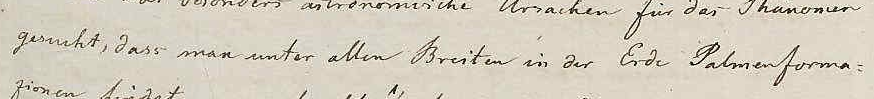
gesucht, dass man unter allen Breiten in der Erde Palmenforma-
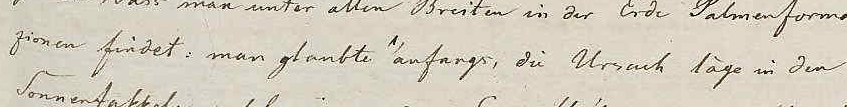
zionen findet: man glaubte 1, anfangs, die Ursach läge in den
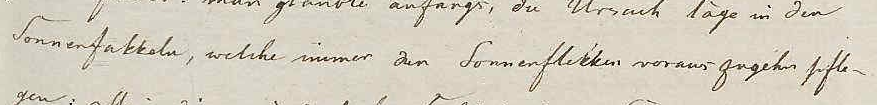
Sonnenfakkeln, welche immer den Sonnenflekken vorauszugehn pfle-
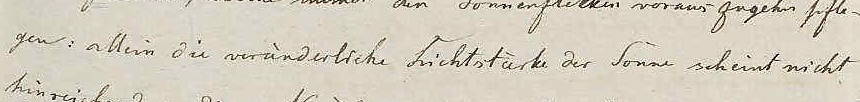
gen: allein die veränderliche Lichtstärke der Sonne scheint nicht
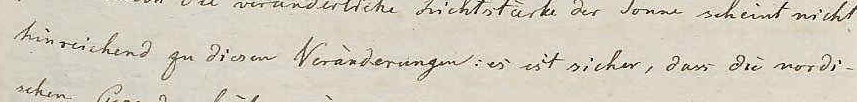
hinreichend zu diesen Veränderungen: es ist sicher, dass die nordi-
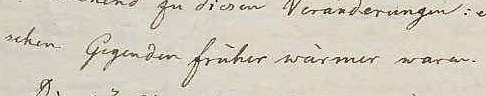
schen Gegenden früher wärmer waren.
